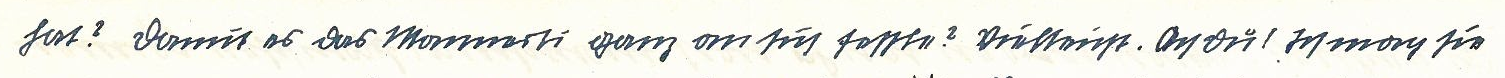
hat? Damit es das Mannerli ganz an sich fessle? Vielleicht. Ach Du! ich mag sie
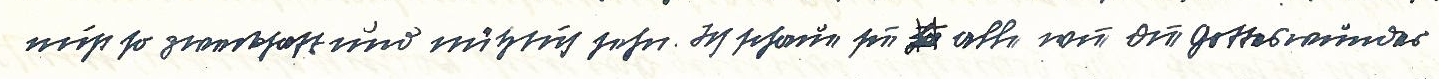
nicht so zweckhaft und nützlich sehn. Ich schaue sie ja alle wie die Gotteswunder
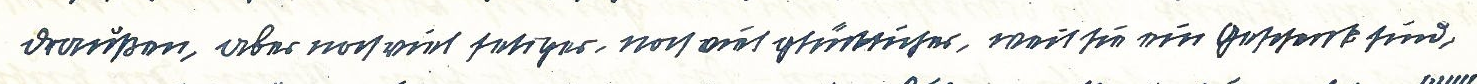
draußen, aber noch viel seliger, noch viel glücklicher, weil sie ein Geschenk sind,
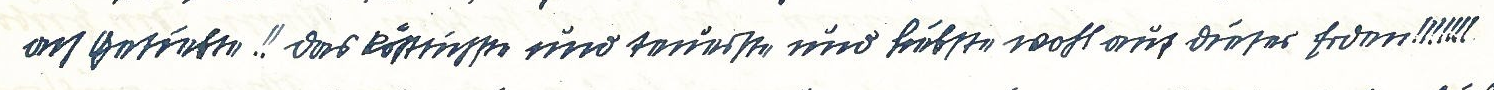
ach Geliebte!! das köstlichste und teuerste und liebste wohl auf dieser Erden !!!!!!!
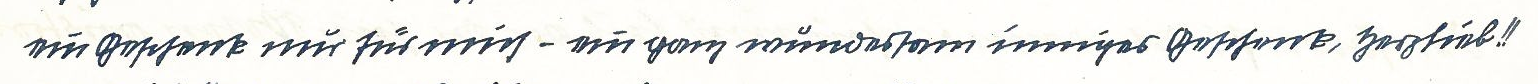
ein Geschenk nur für mich – ein ganz wundersam inniges Geschenk, Herzlieb!!
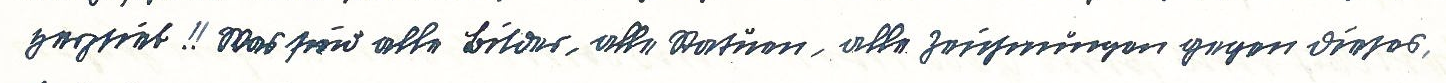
Herzlieb!! Was sind alle Bilder, alle Statuen, alle Zeichnungen gegen dieses,
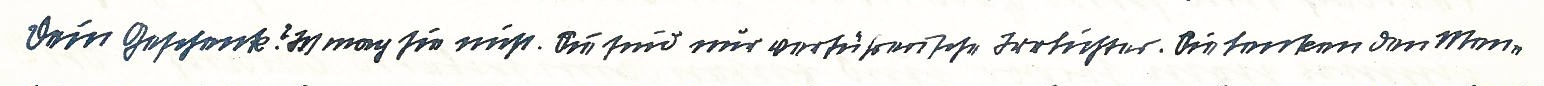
Dein Geschenk? Ich mag sie nicht. Sie sind nur verführerische Irrlichter. Sie lenken den Men¬
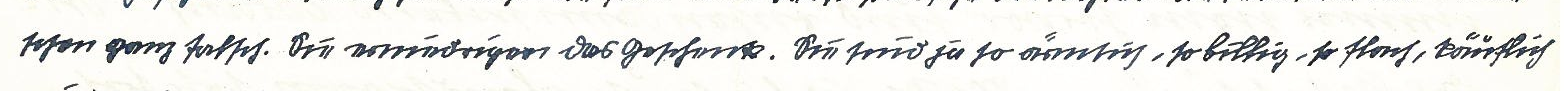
schen ganz falsch. Sie erniedrigen das Geschenk. Sie sind ja so ärmlich, so billig, so flach, käuflich
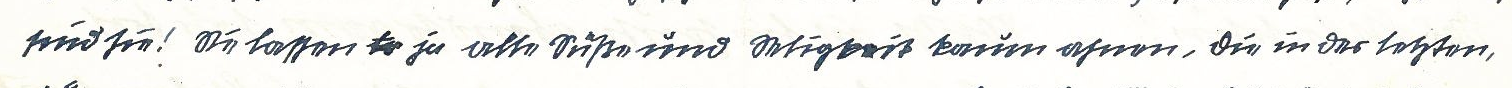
sind sie! Sie lassen ja alle Süße und Seligkeit kaum ahnen, die in der letzten,
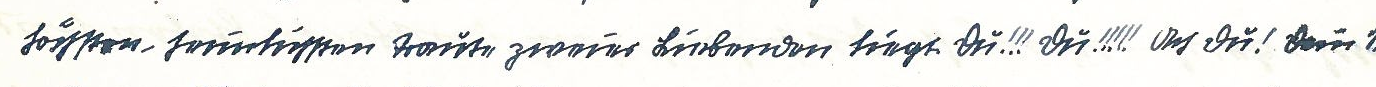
höchsten, heimlichsten Traute zweier Liebender liegt. Du!!! Du!!!!! Ach Du! Dein
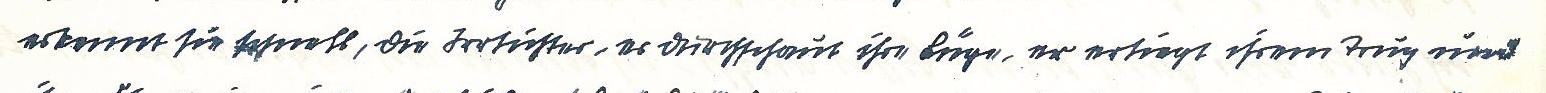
erkennt sie schnell, die Irrlichter, er durchschaut ihre Züge, er erliegt ihrem Trug und
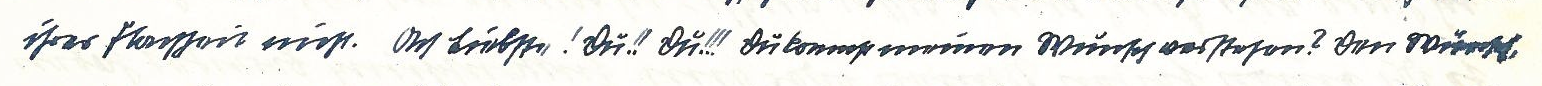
ihrer Flachheit nicht. Ach Liebste! Du!! Du!!! Du kannst meinen Wunsch verstehen? Den Wunsch,
